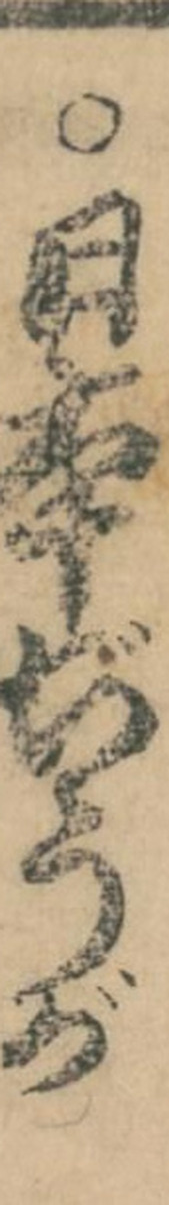◯日本ぢうが
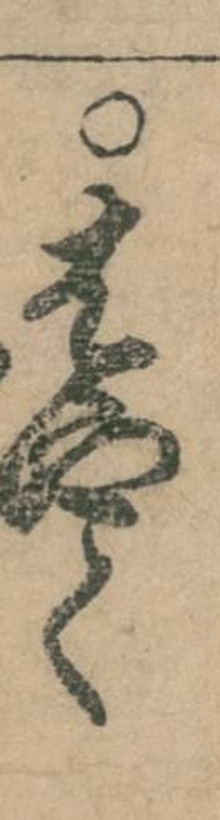◯はやく
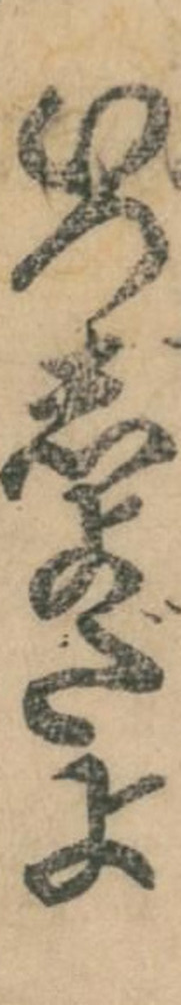いつしよだよ
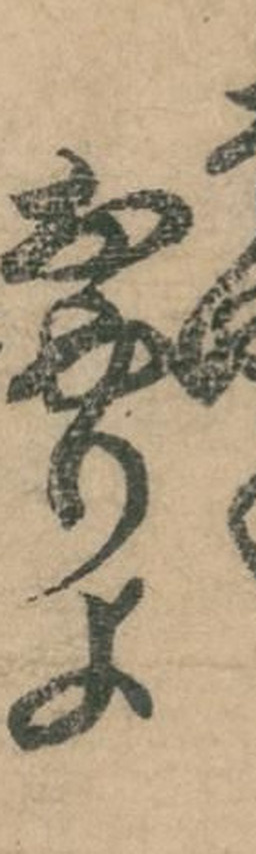おやりよ
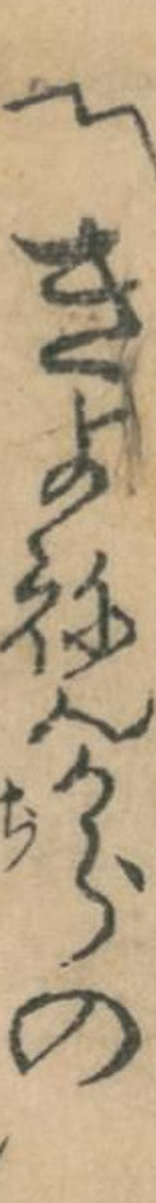〽きよねんからの
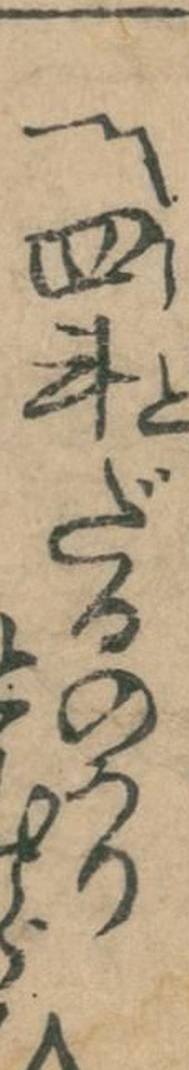〽四斗だるのかり
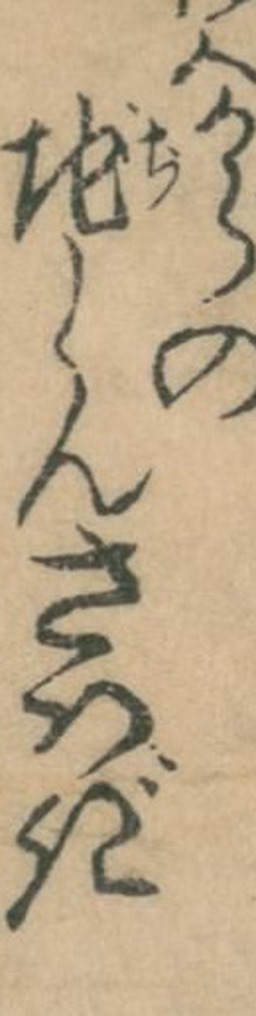地しんさはぎ
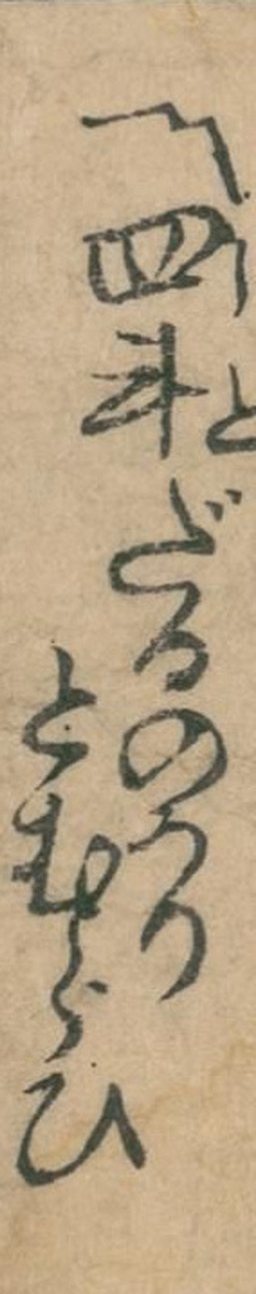〽四斗だるのかり
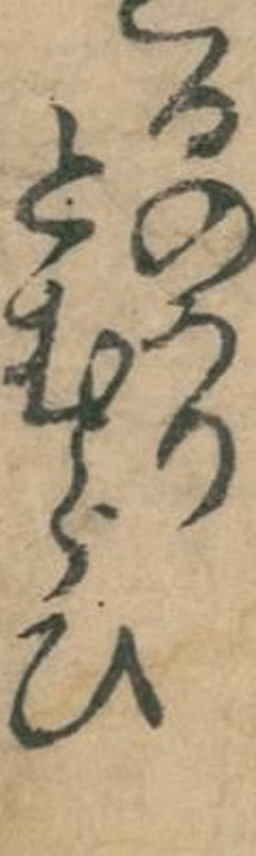とむらひ
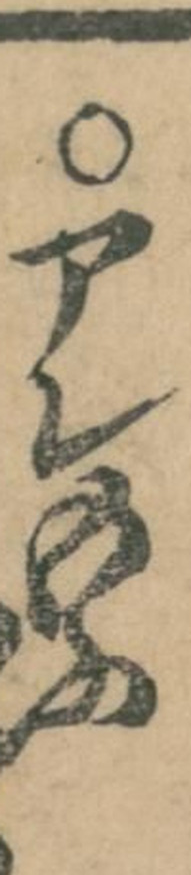◯アレもふ
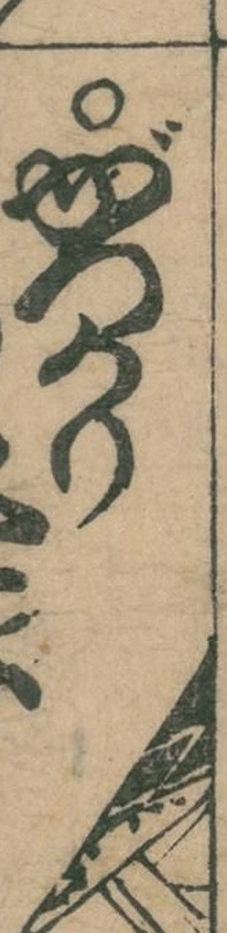◯がつかり
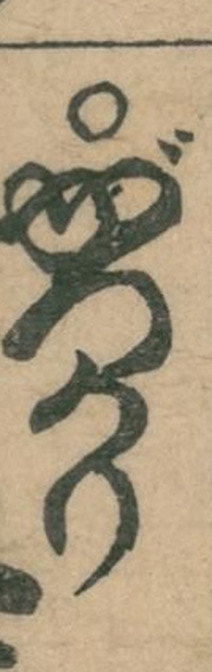◯がつかり
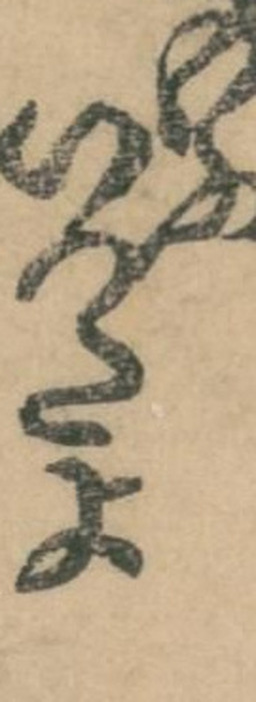いつたよ
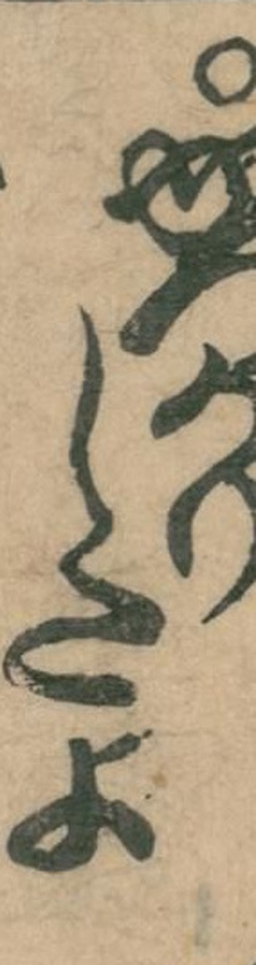したよ
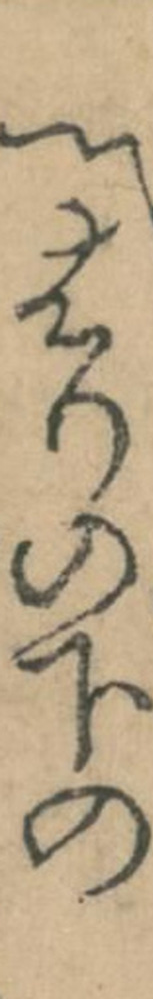〽はりの下の
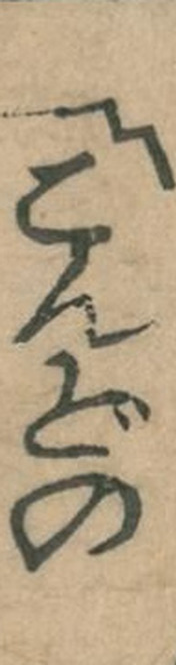〽こんどの
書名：地震出火　例のおわらひ
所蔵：東京大学地震研究所図書室 Earthquake Research Institute Library, The University of Tokyo, JAPAN
